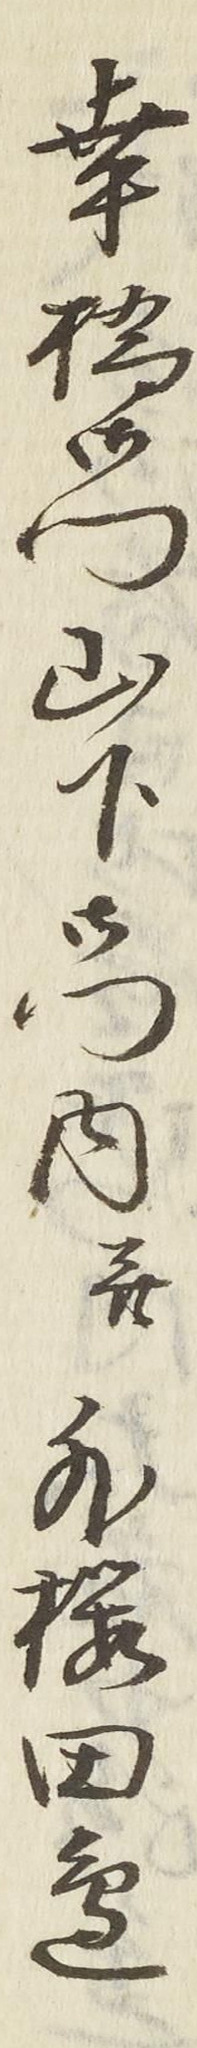幸橋御門山下御門内幷外桜田辺
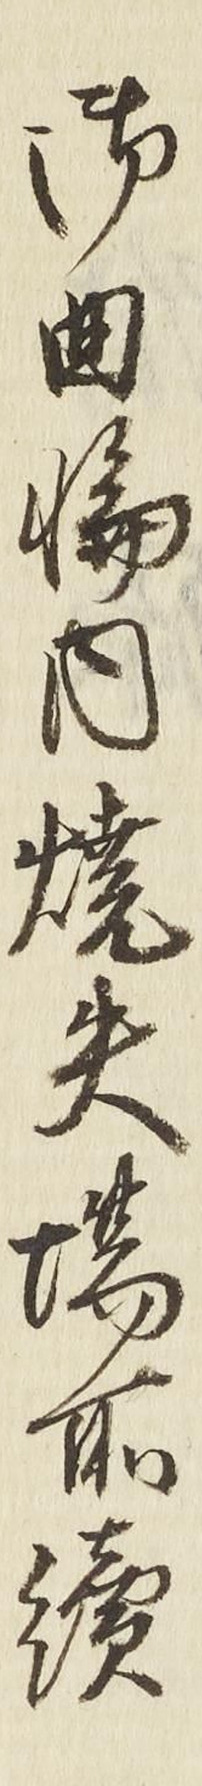御曲輪内焼失場所続
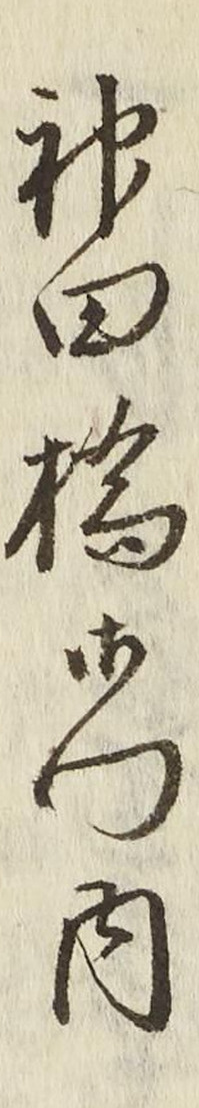神田橋御門内
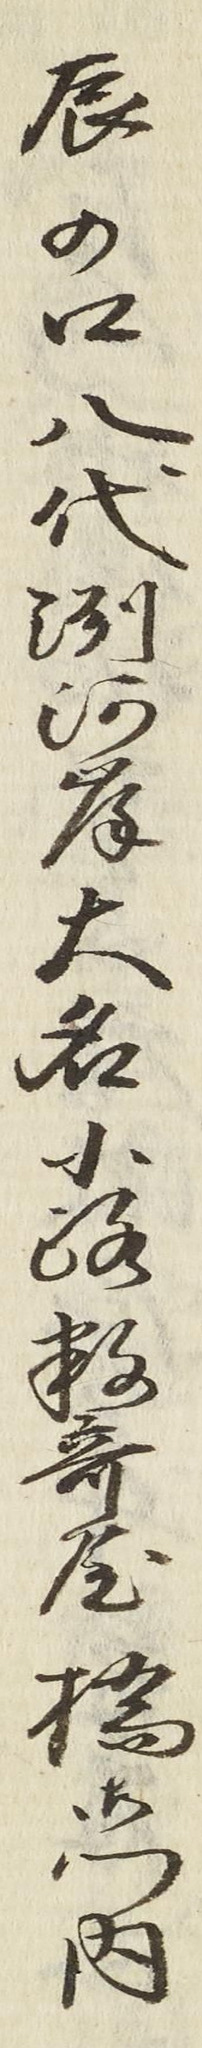辰の口八代洲河岸大名小路数寄屋橋御門内
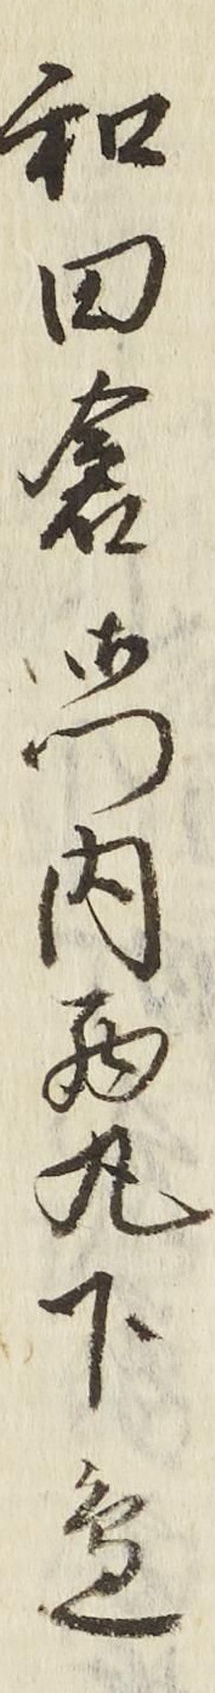和田倉御門内西丸下辺
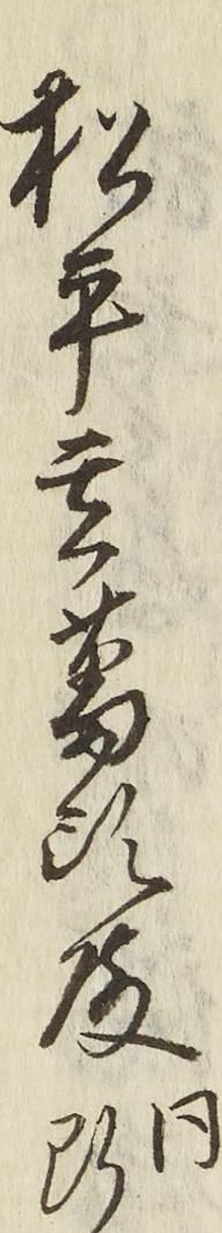松平玄蕃頭殿同断
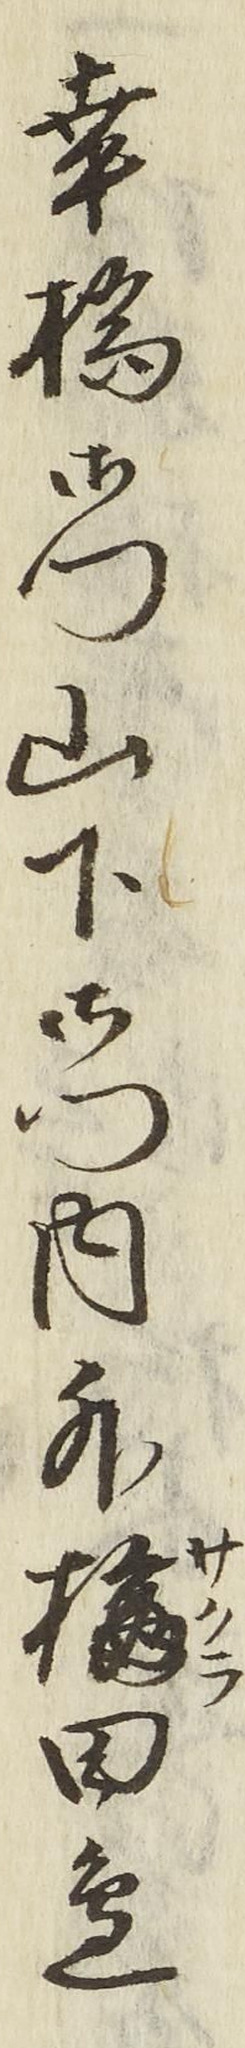幸橋御門山下御門内外桜田辺

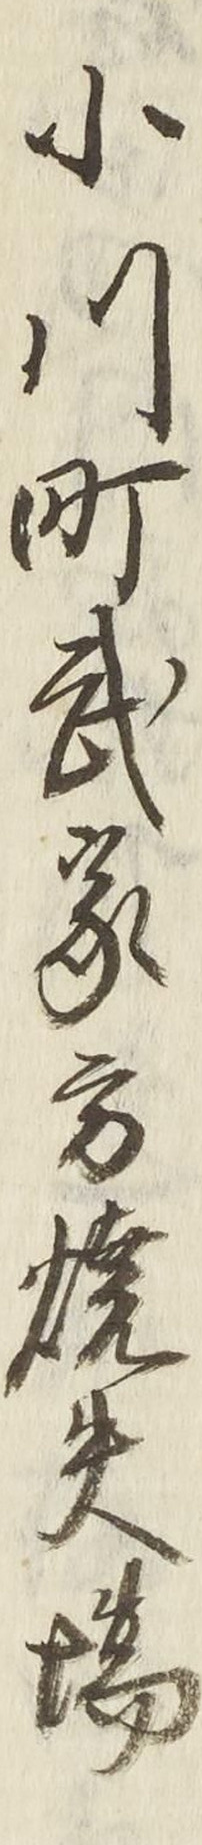小川町武家方焼失場
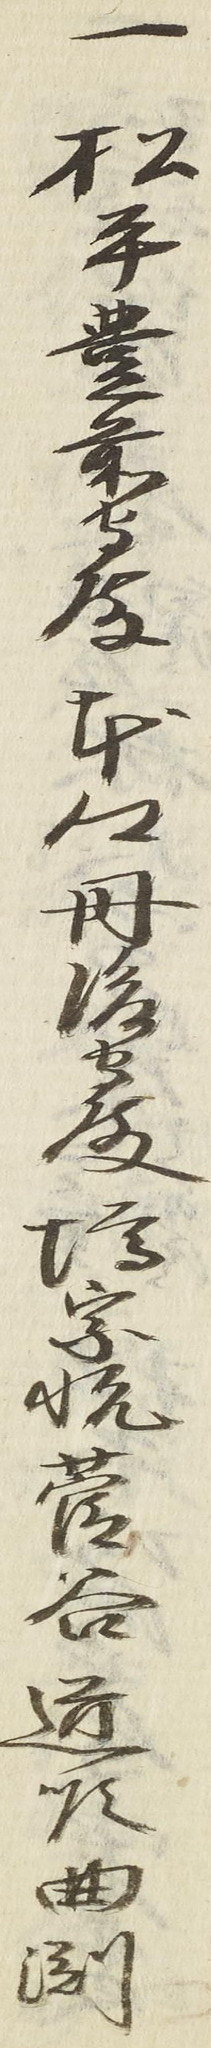一松平豊前守殿本郷丹後守殿塙宗悦菅谷道順曲渕
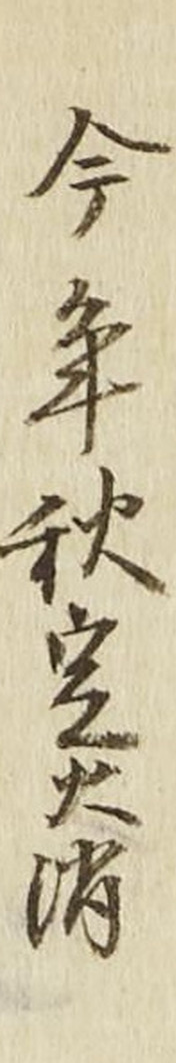今年秋定火消
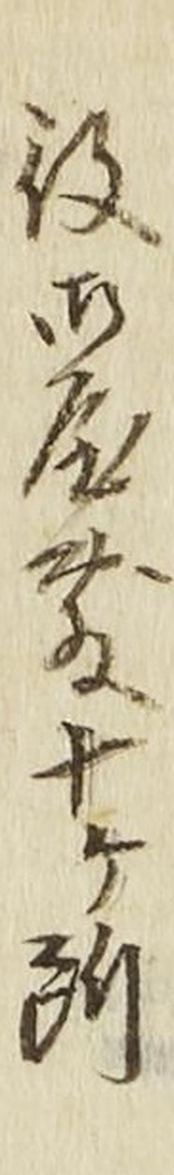役御屋敷十ケ所
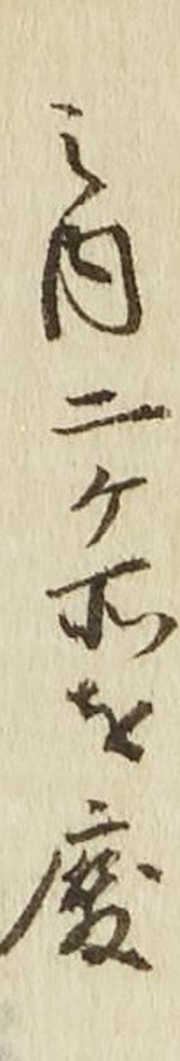之内二ケ所を廃
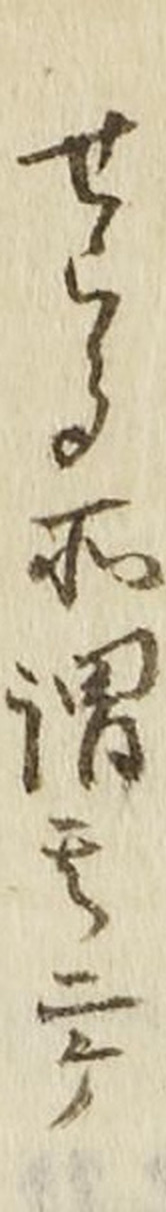せらる所謂其二ケ
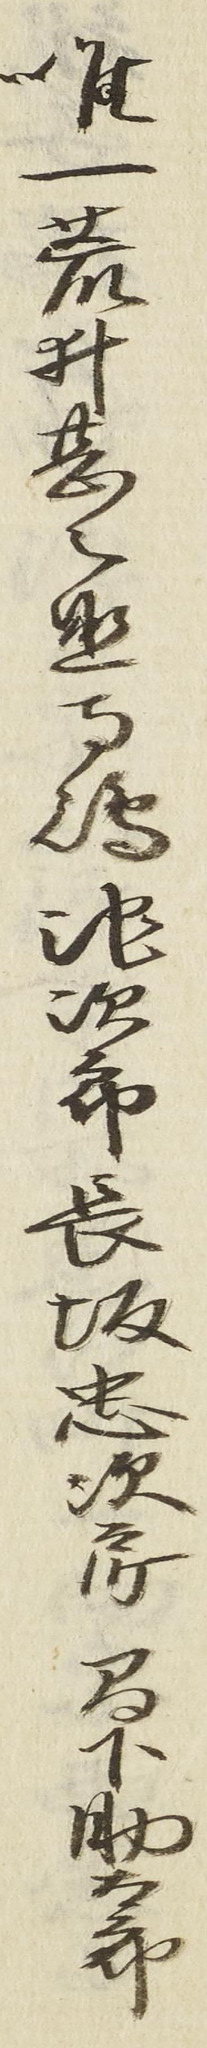唯一荒井甚之丞寺島池次郎長坂忠次郎間下助太郎
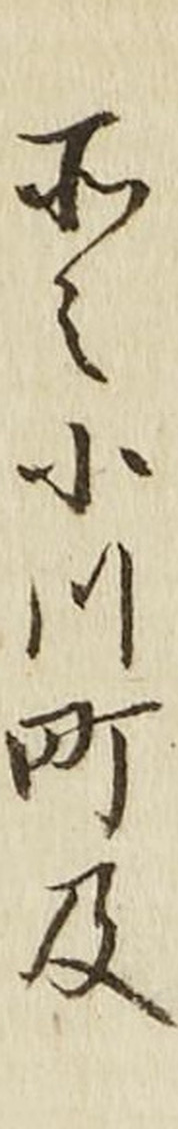所之小川町及
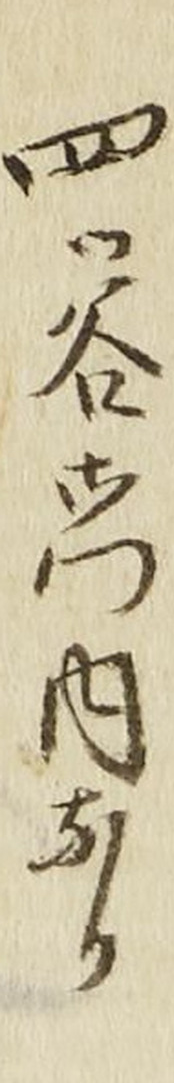四ツ谷御門内なり
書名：やぶれ窓の記　全
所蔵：東京大学地震研究所図書室 Earthquake Research Institute Library, The University of Tokyo, JAPAN
